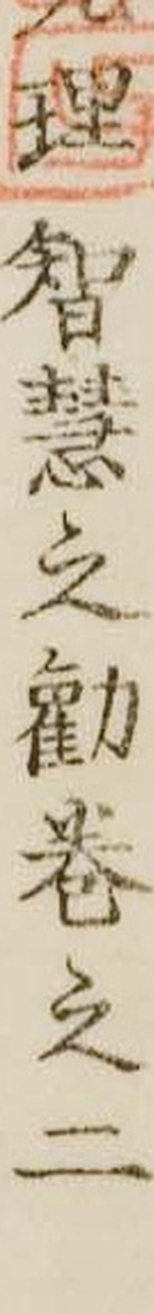究理智慧之勧巻之二
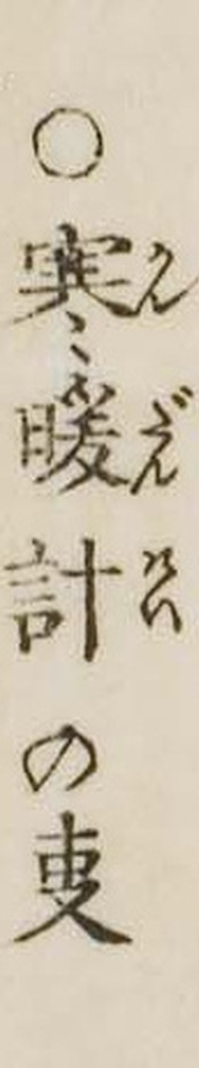○寒暖計の叓
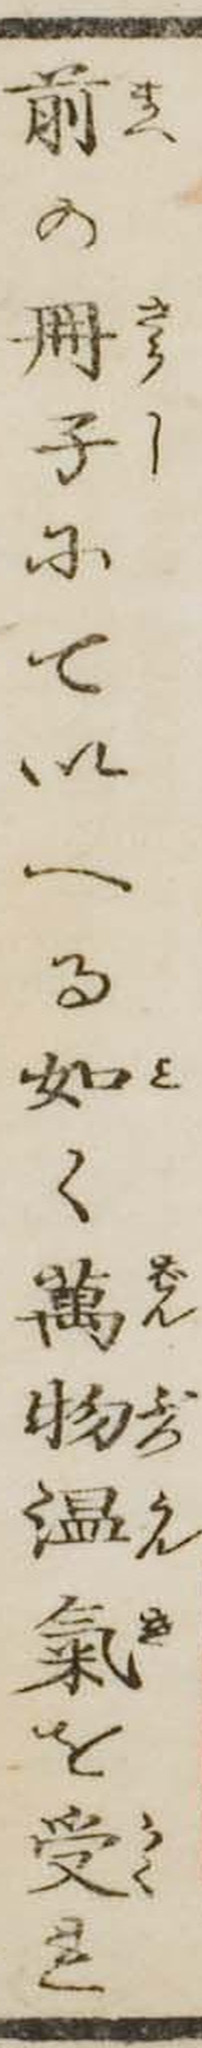前の冊子にていへる如く萬物温氣を受れ
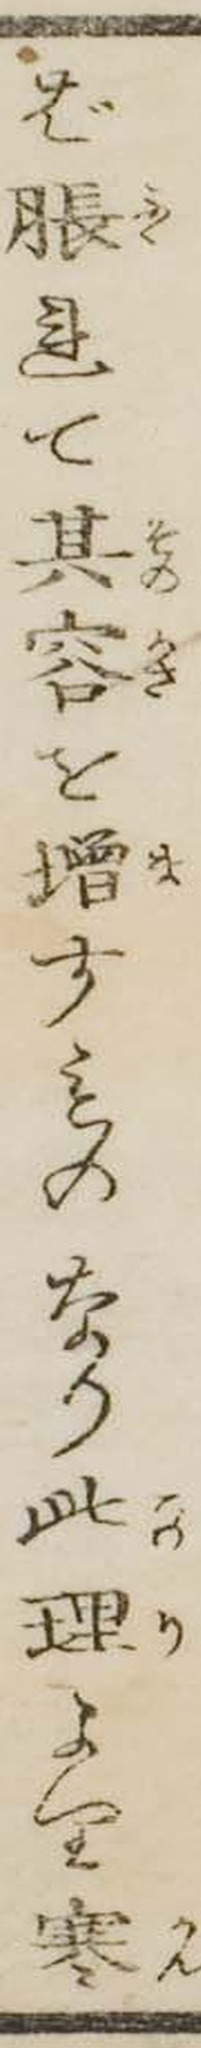ば脹れて其容を増すものなり此理より寒
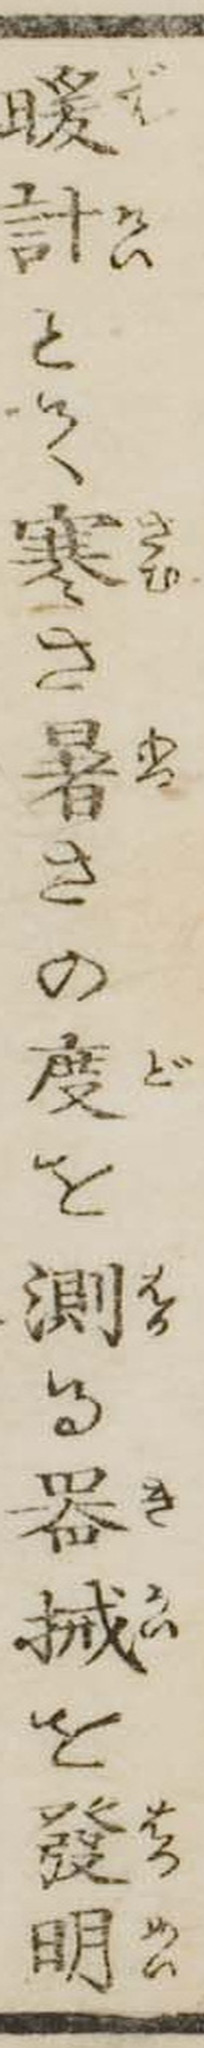暖計とて寒さ暑さの度を測る器械を発明
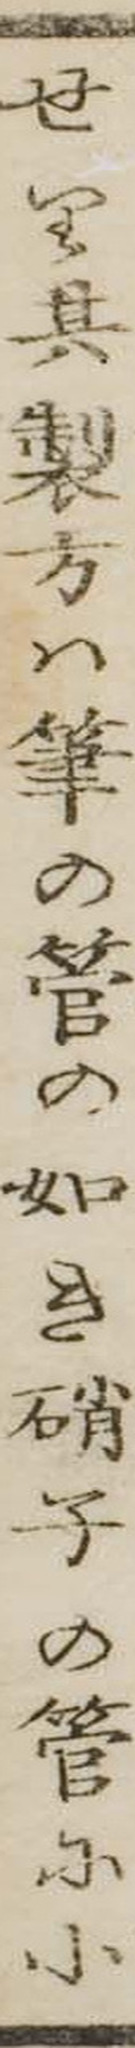せり其製方は筆の管の如き硝子の管に小

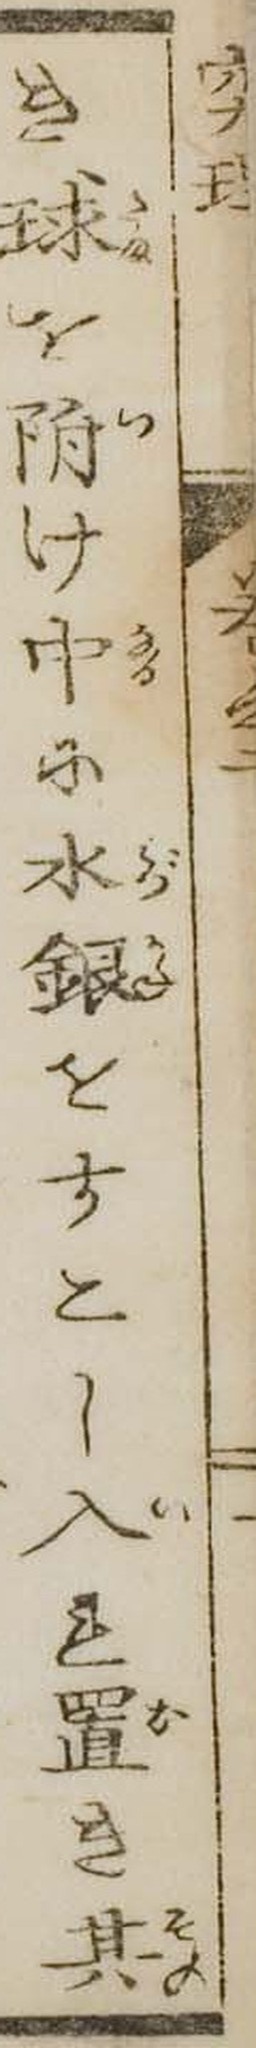き球を附け中に水銀をすこし入れ置き其
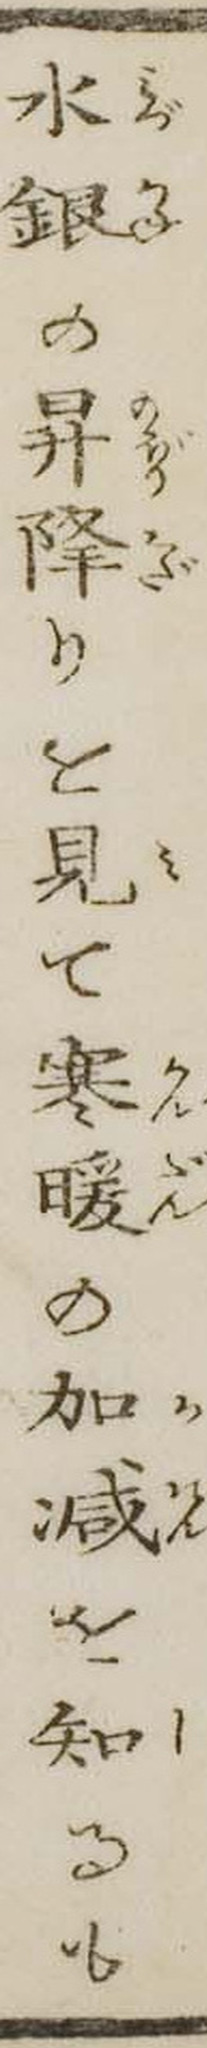水銀の昇降りを見て寒暖の加減を知るも
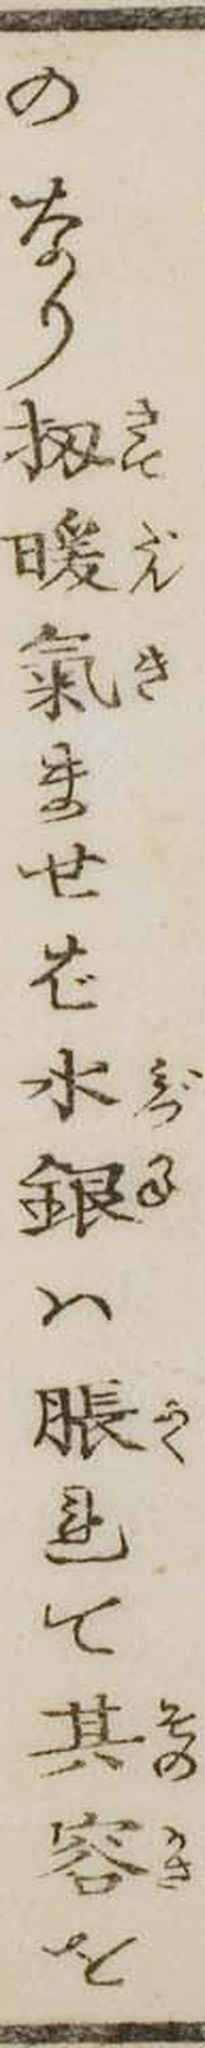のなり扨暖氣ませば水銀は脹れて其容を
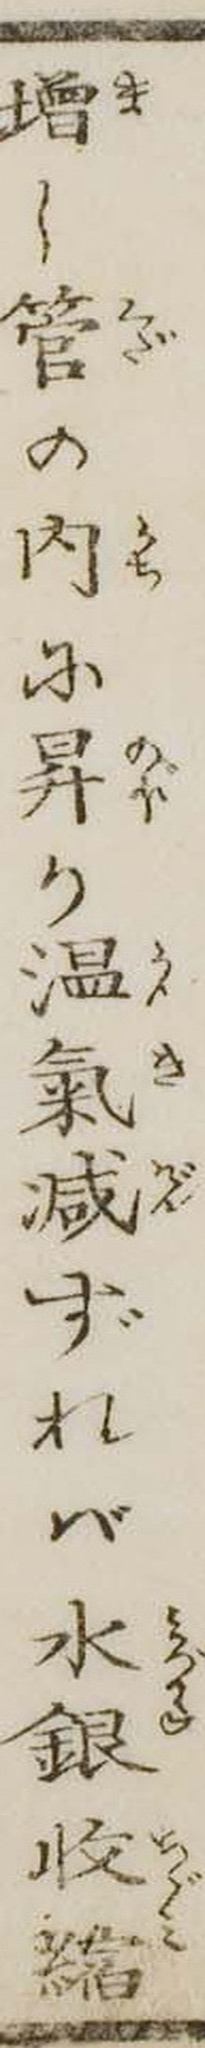増し管の内に昇り温氣減ずれば水銀収縮
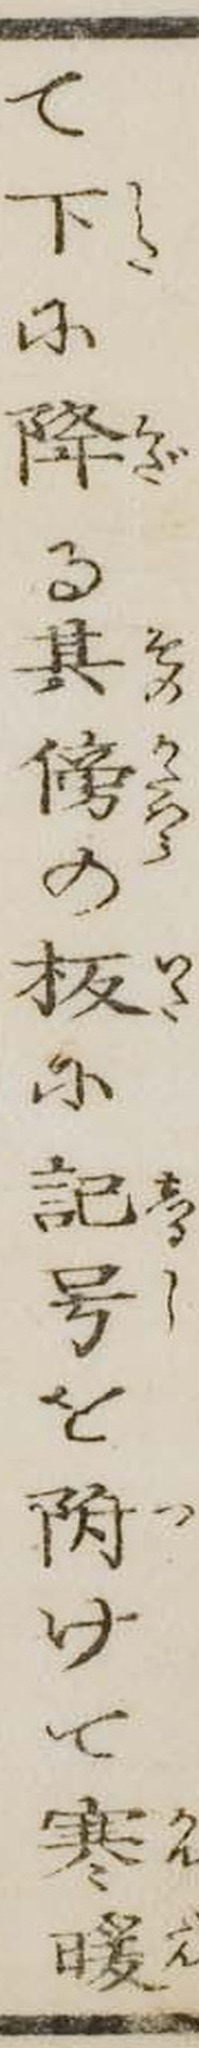て下に降る其傍の板に記号を附けて寒暖
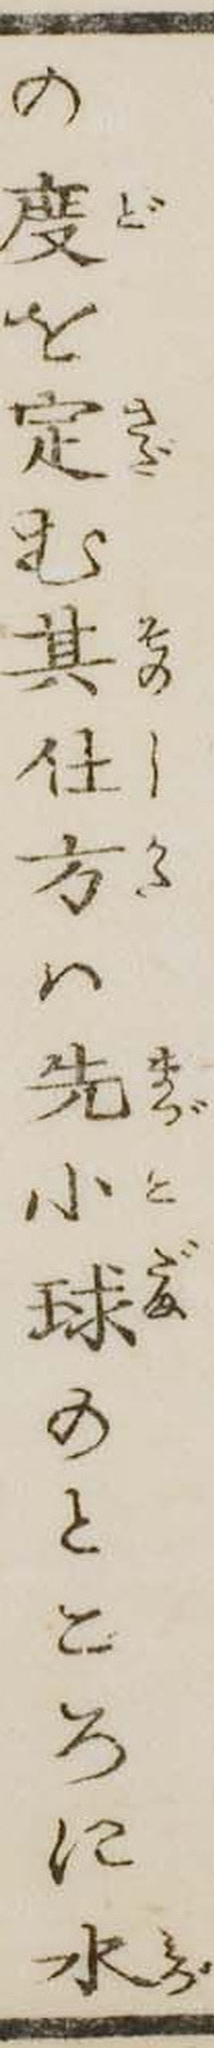の度を定む其仕方は先小球のところに水
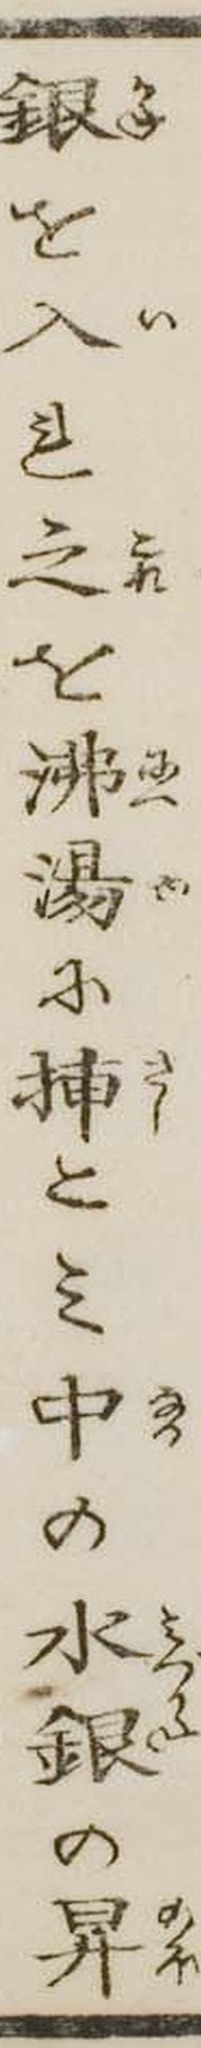銀を入れ之を沸湯に挿こみ中の水銀の昇
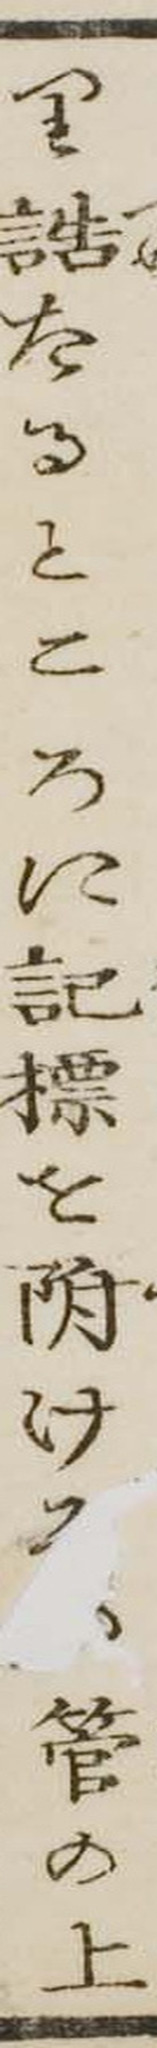り詰たるところに記標を附け管の上
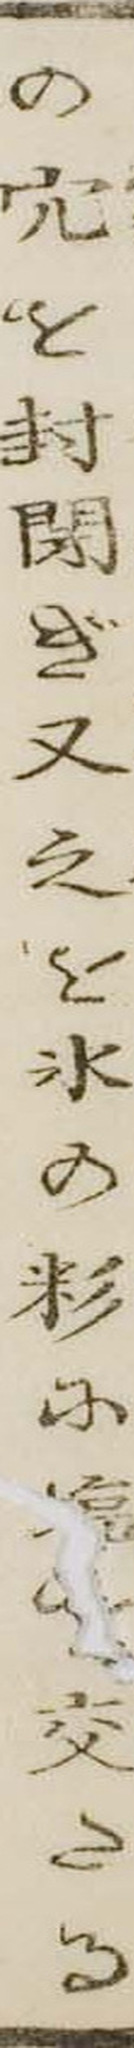の穴を封閉ぎ又之を氷の粉に塩を交たる
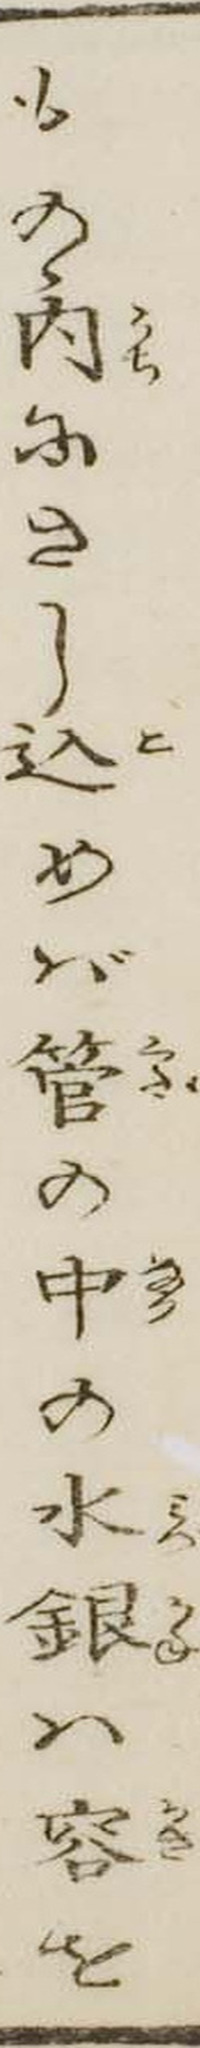ものゝ内にさし込めば管の中の水銀は容を
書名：究理知慧の勧 : 訓蒙画入 巻之2
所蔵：東京学芸大学附属図書館
